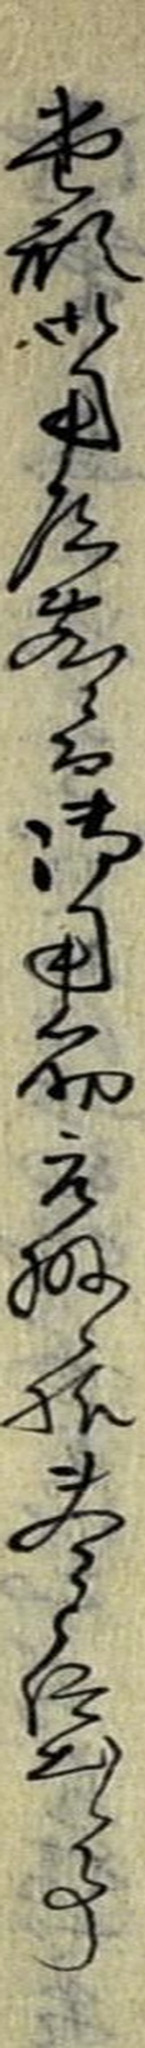堂形御用部屋ニ而御用筋取扱候様夫々被仰出候事
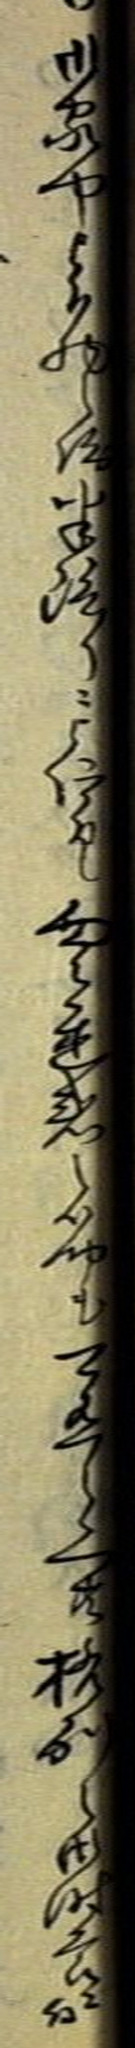〇御家中被下物之儀半渡りニ被仰付候面々迷惑之筋も可有之候へ共格別之御時節ニ付
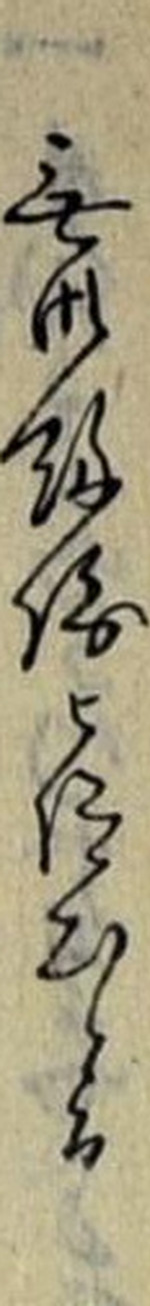無御余儀被仰出候旨
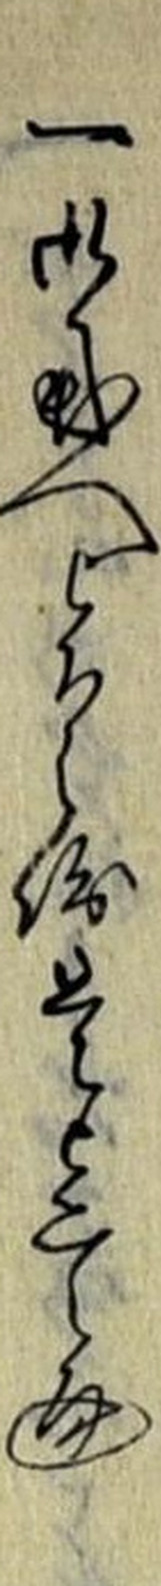一御用人被下之儀是迄之通
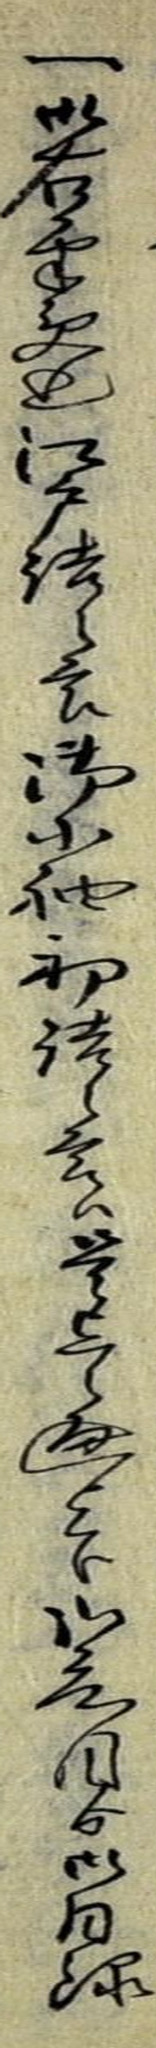一御右筆受込江戸詰之節御小袖初詰之節ハ是迄之通被下弐度目ゟ御目録
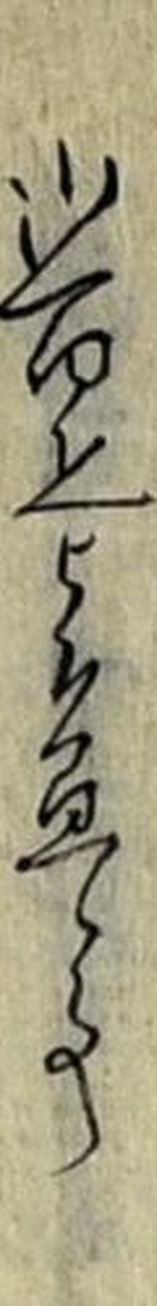弐百疋被下置候事
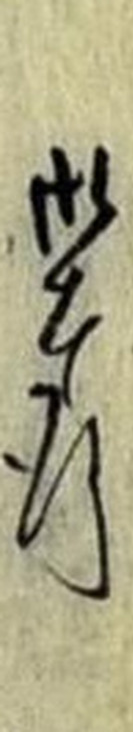御奉行
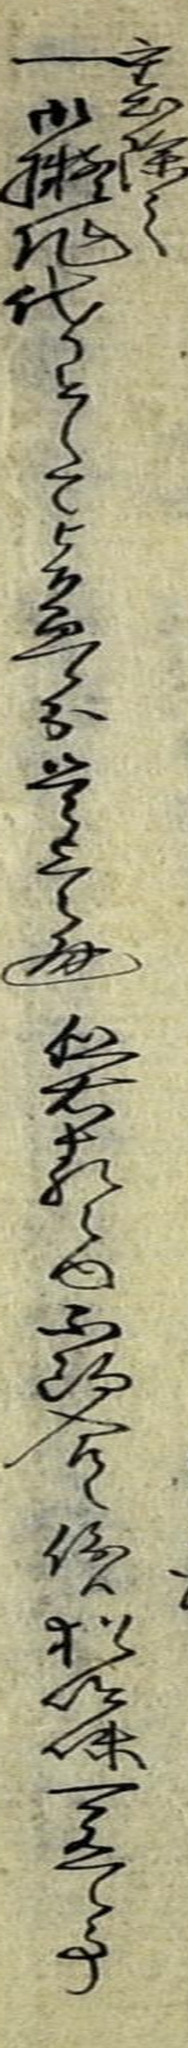一御擬作代りとして被下置候分是迄之通但右類之内不釣合之儀ハ猶吟味可有之事
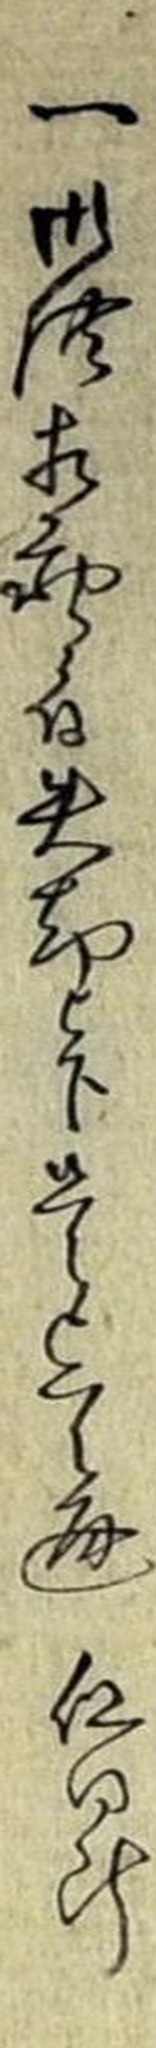一御供相勤候ニ付失却被下是迄之通但同断
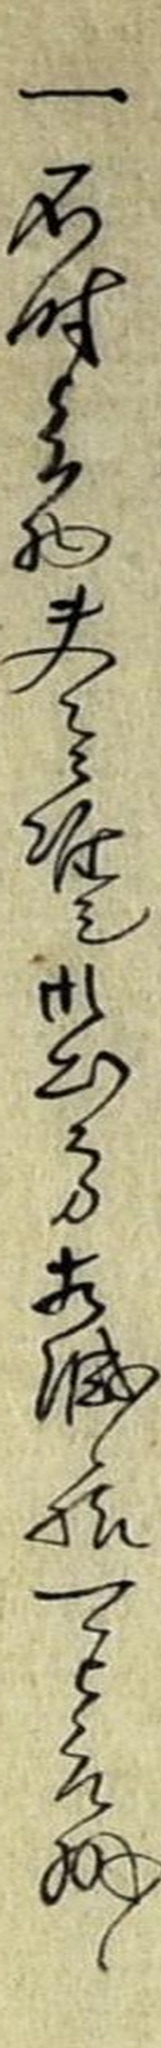一不時被下物夫々ニ准シ御出方相減候様可被取扱候
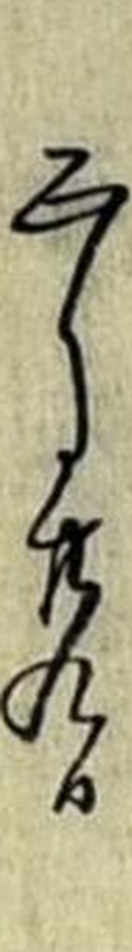正月廿九日
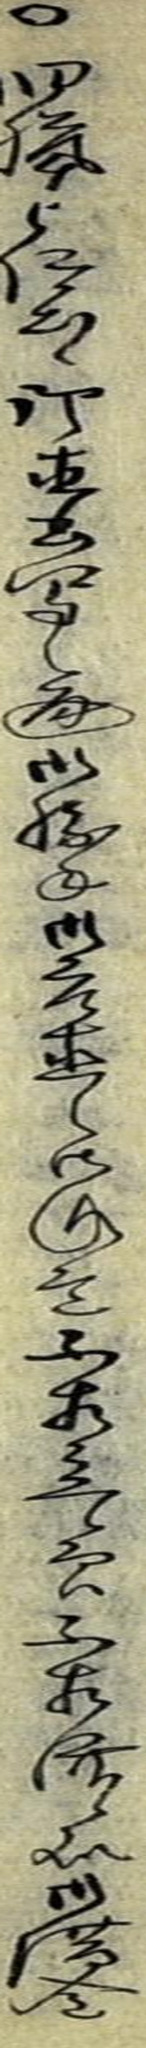〇旧臘被仰出候御直書写之通御勝手御取直し御趣意不相立候而ハ不相済候処御借金
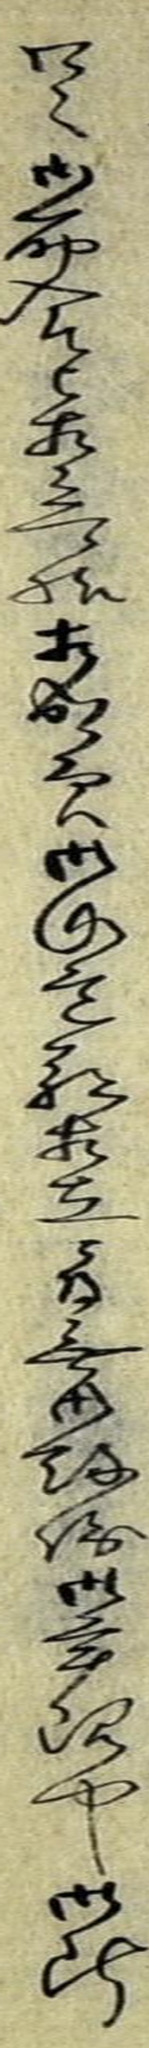口々へ御筋合被相立候様相成候而ハ御趣意難相立ニ付無御余儀御年限中御断
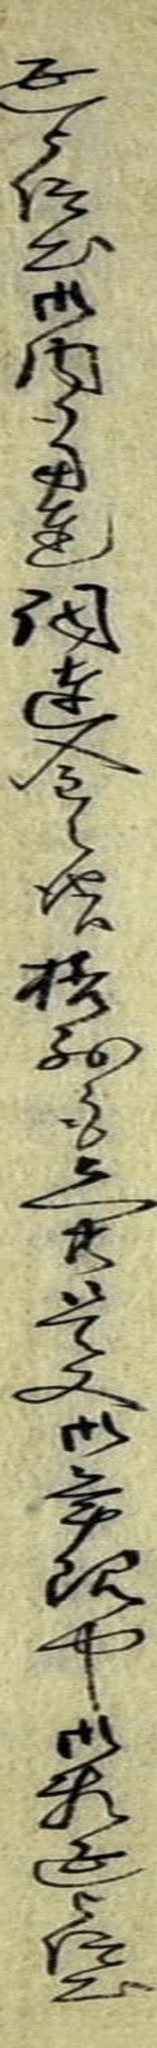延被仰出御内御用達調達金之儀ハ格別ニも候へ共是又御年限中御頼延被仰出
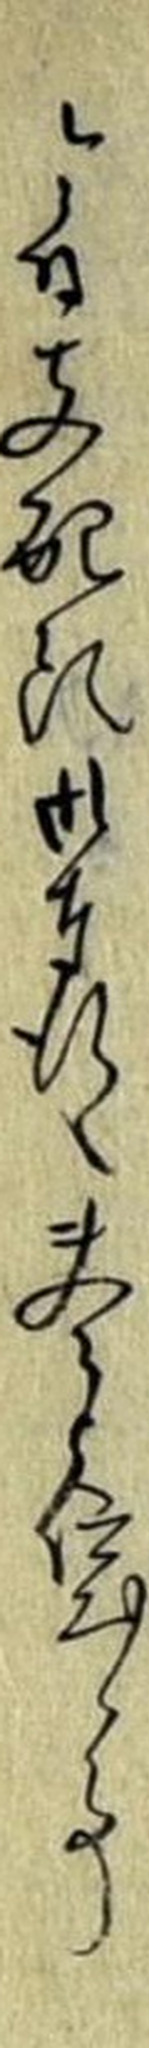候ニ付支配頭御奉行へ夫々被仰出候事

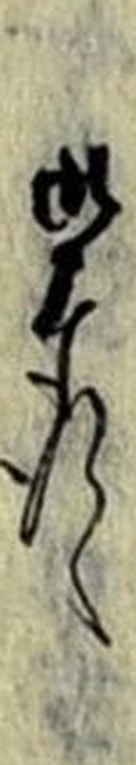御奉行へ
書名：命令之部 三
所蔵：福井県文書館 Fukui Prefectural Archives
